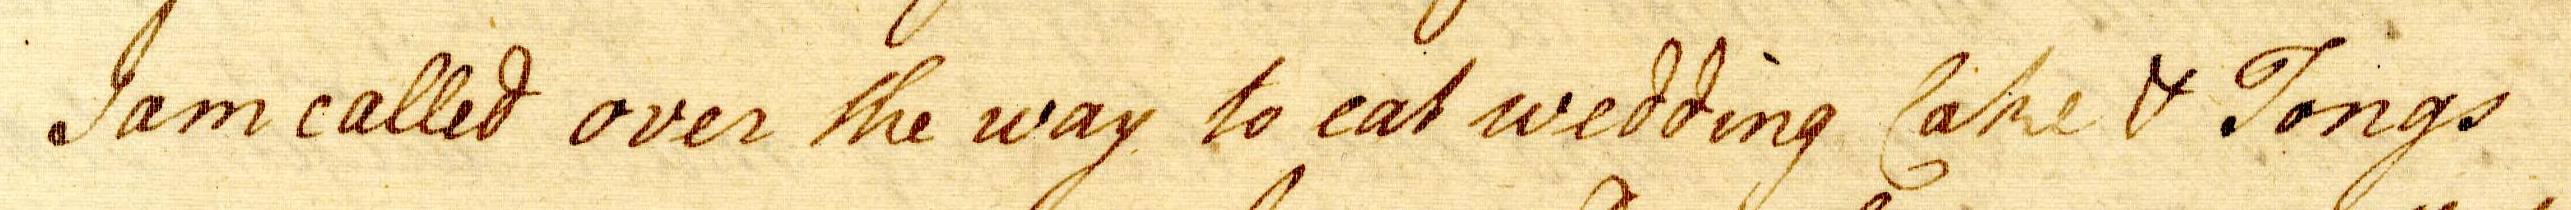I am called over the way to eat wedding Cake & Tongs
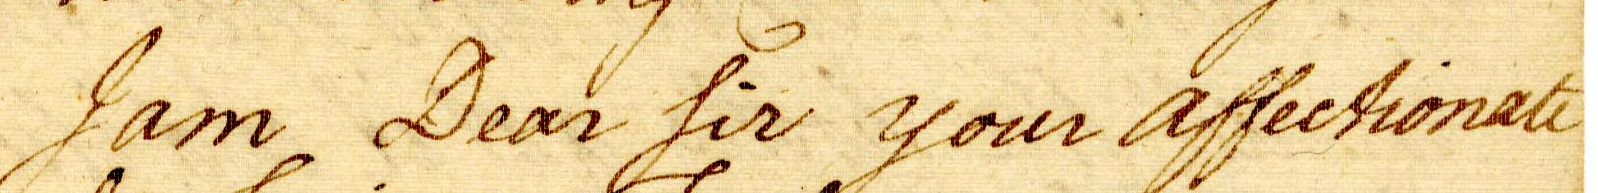I am Dear sir your affectionate
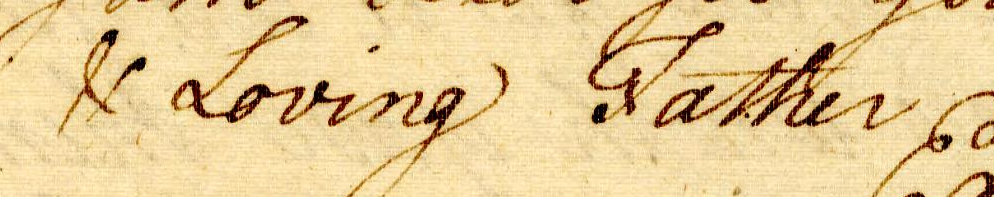& Loving Father
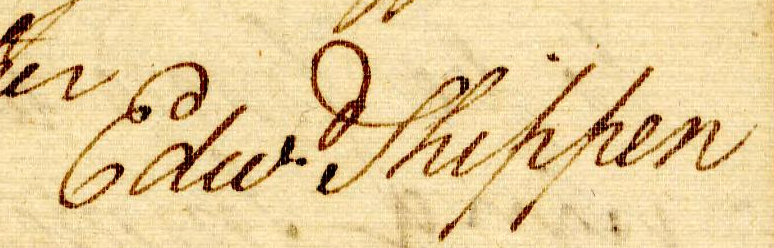Edw.^d Shippen
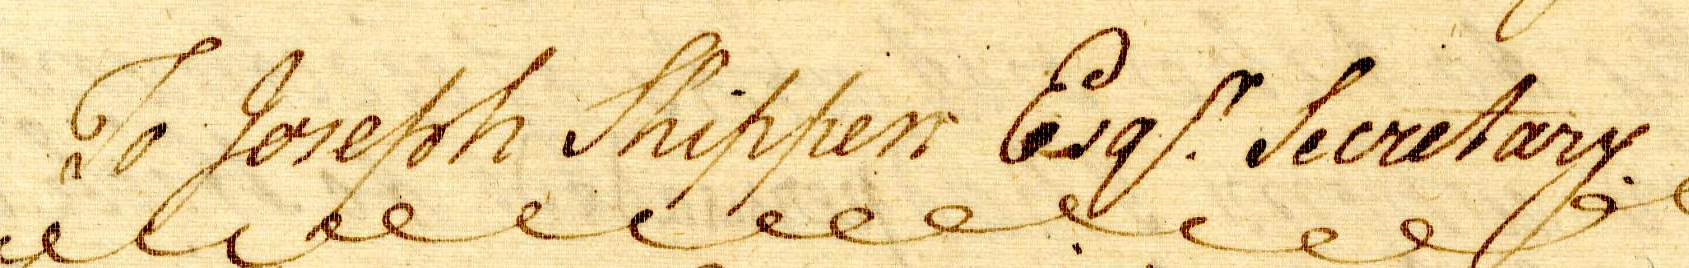To Joseph Shippen Esq^r. Secretary.
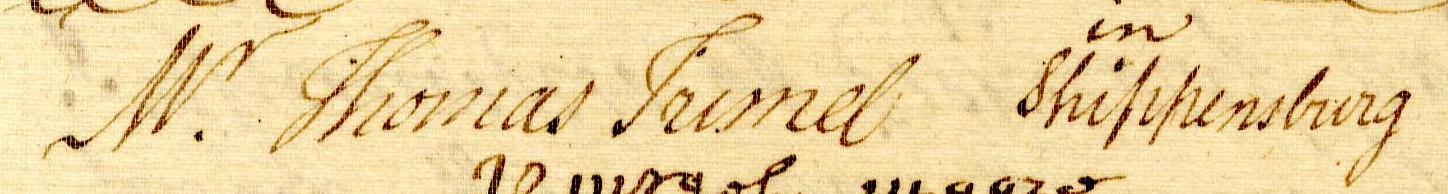M^r. Thomas Trimel Shippensburg
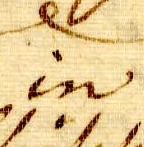in
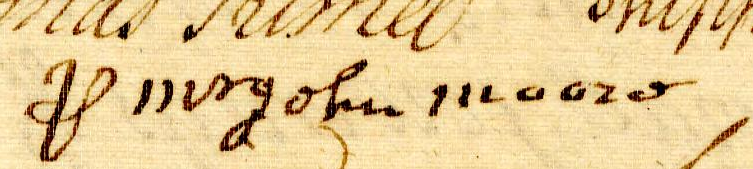& M^r John Moore
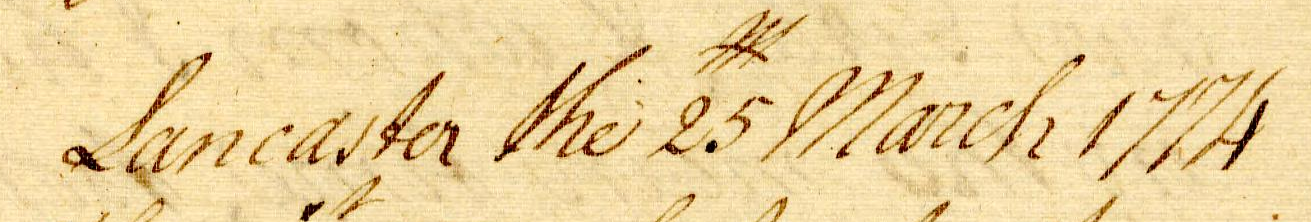Lancaster the 25^th March 1774
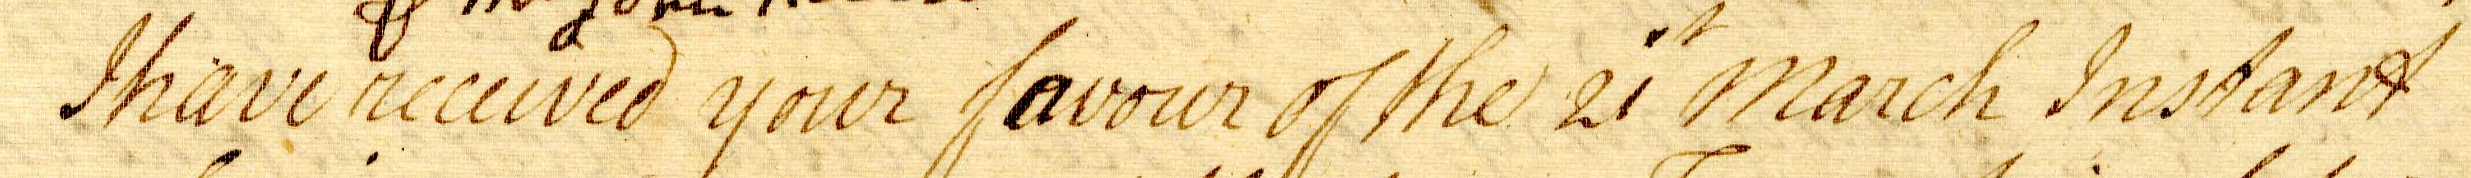I have received your favour of the 21^t March Instant
